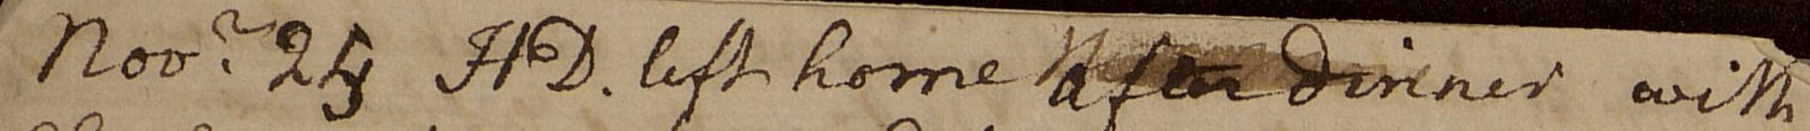Nov^r. 25 HD. left home after dinner with
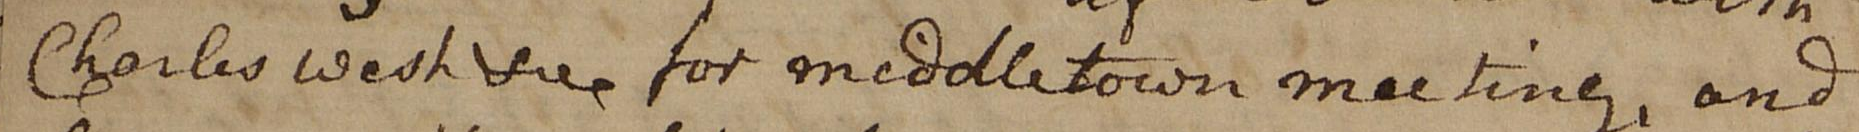Charles West &c for middletown meeting, and
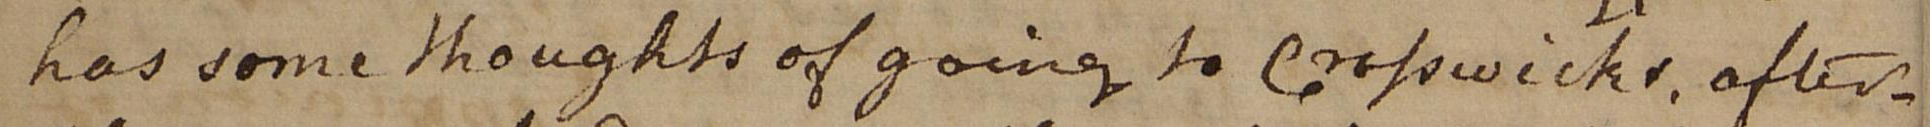has some thoughts of going to Crosswicks, after-
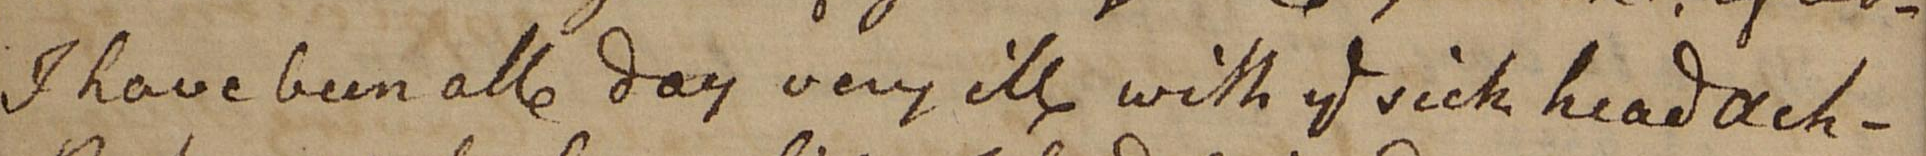I have been all day very ill with y^e sick head ach-
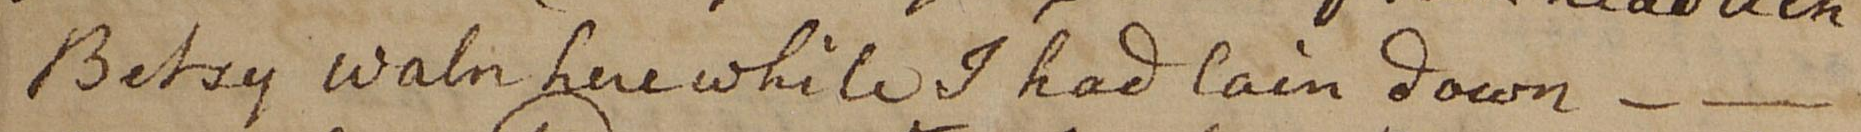Betsy Waln here while I had lain down--
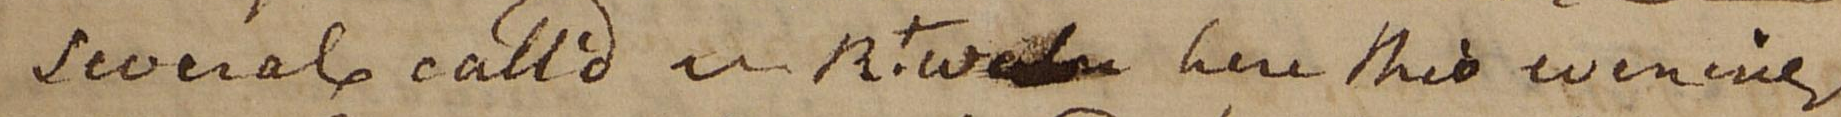several call'd - R^t. Waln here this evening
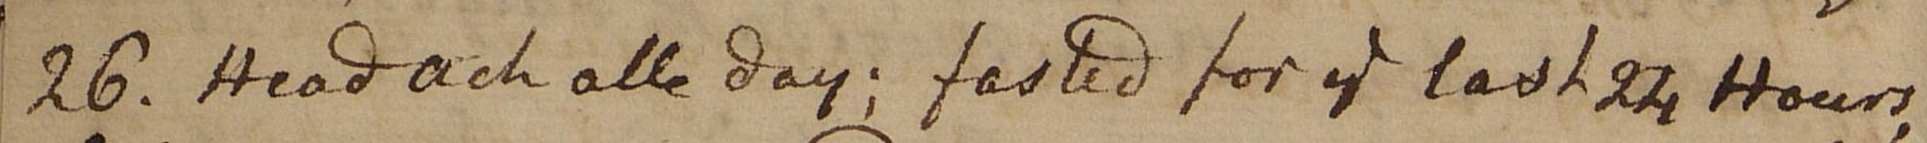26. Head ach all day; fasted for y^e last 24 Hours,
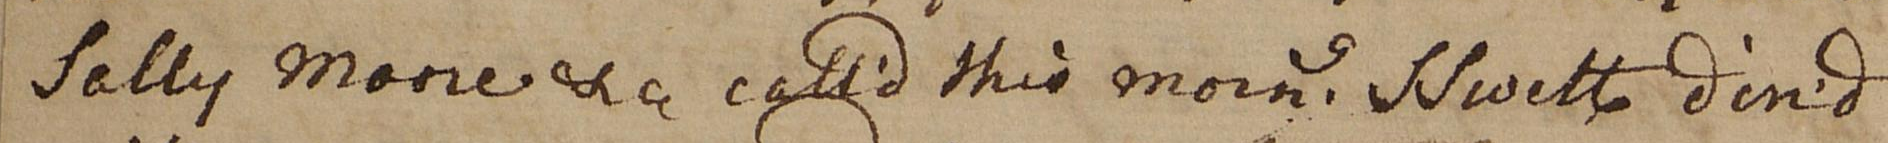Sally Moore &c call'd this morn^g. S Swett din'd
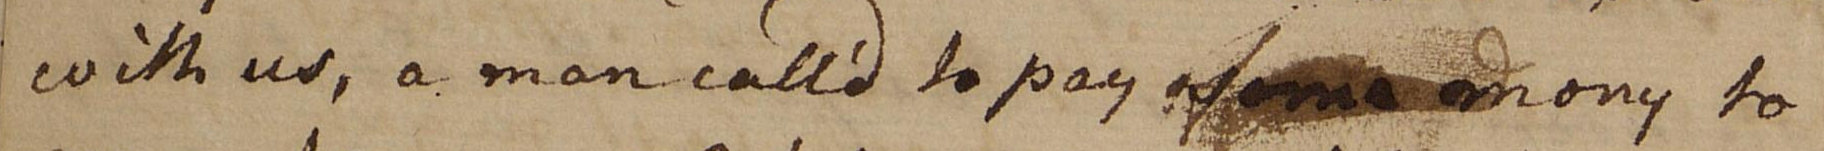with us, a man call'd to pay some mony to
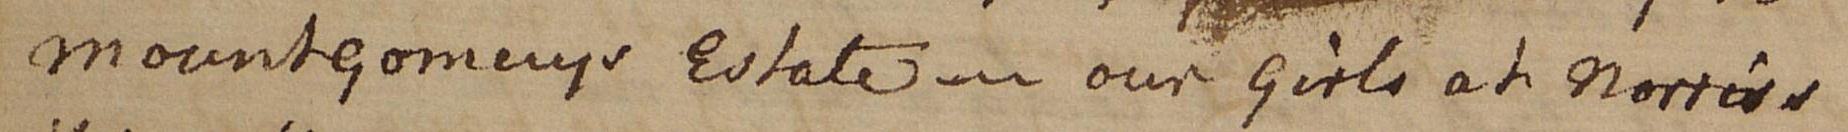mountgomerys Estate - our Girls at Norriss
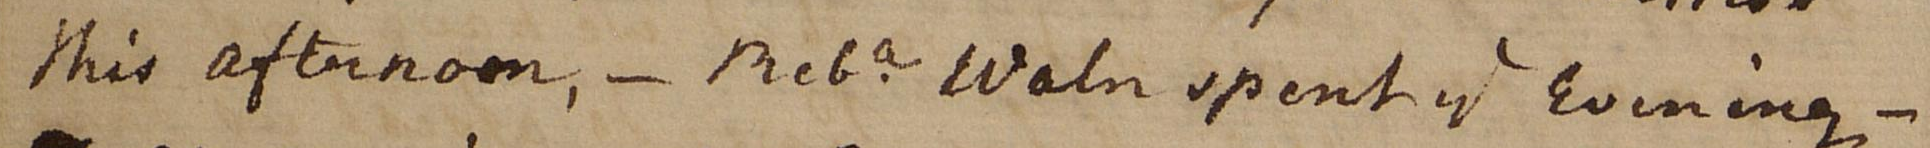this afternoon,- Reb^a. Waln spent y^e Evening-
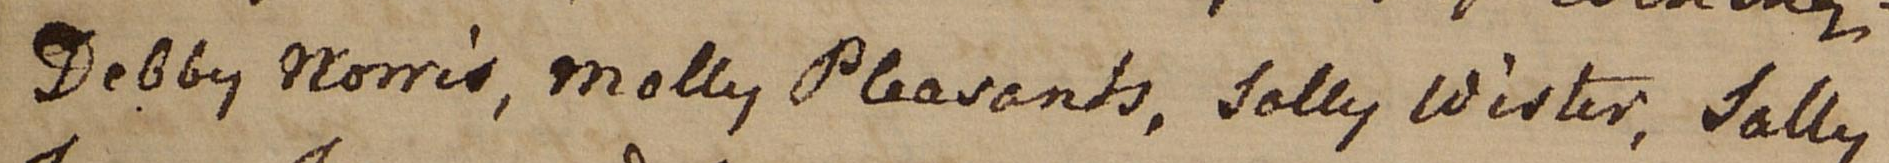Debby Norris, Molly Pleasants, Sally Wister, Sally
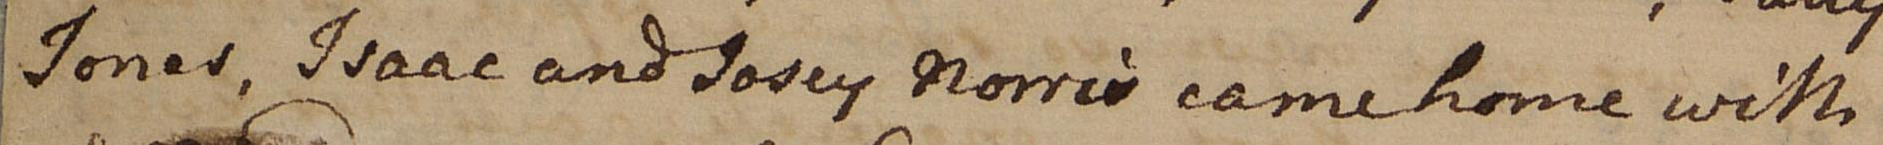Jones, Isaac and Josey Norris came home with
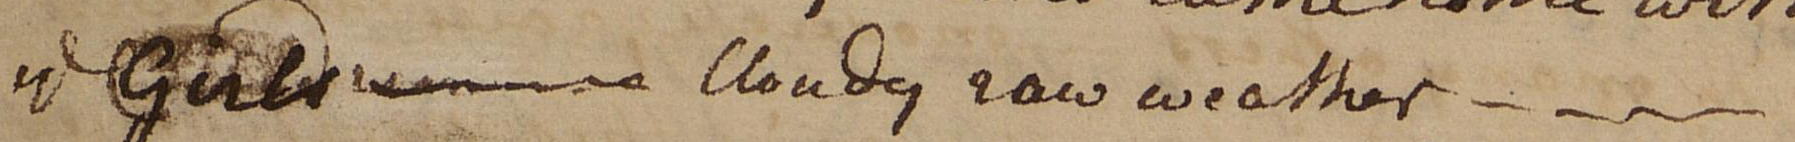y^e Girls- Cloudy raw weather--
